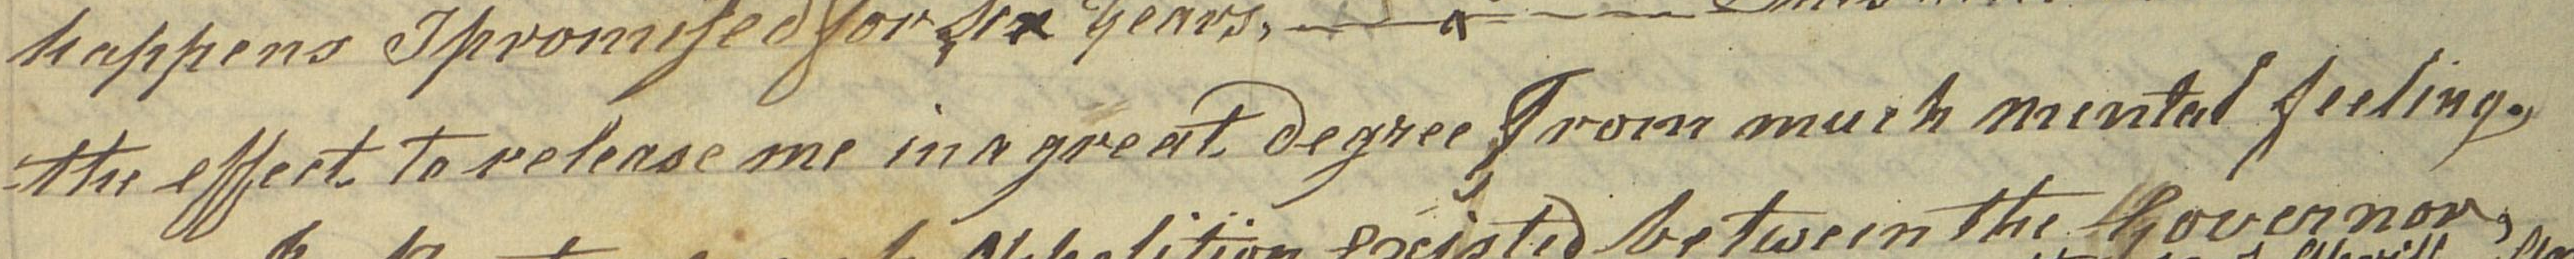the effect to release me in a great degree from much mental feeling
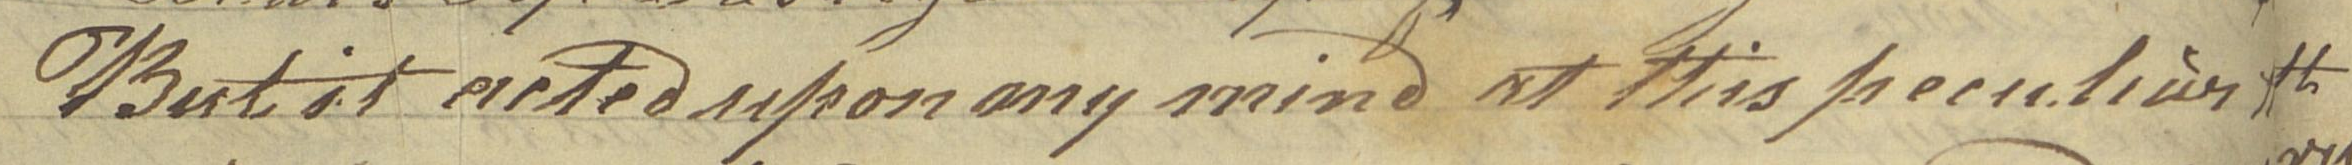But it acted upon my mind at this peculiar
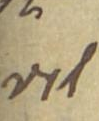-vil
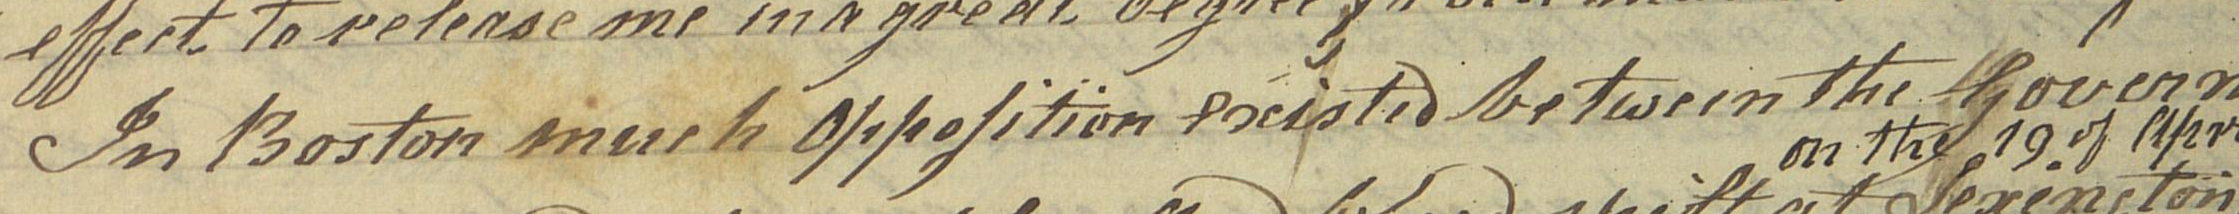In Boston much opposition Existed between the Governor
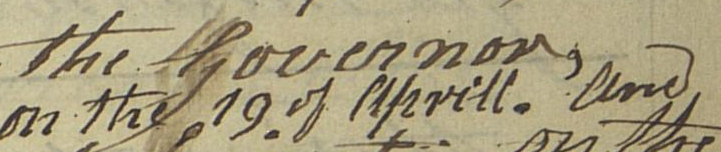on the 19 of Aprill. And,
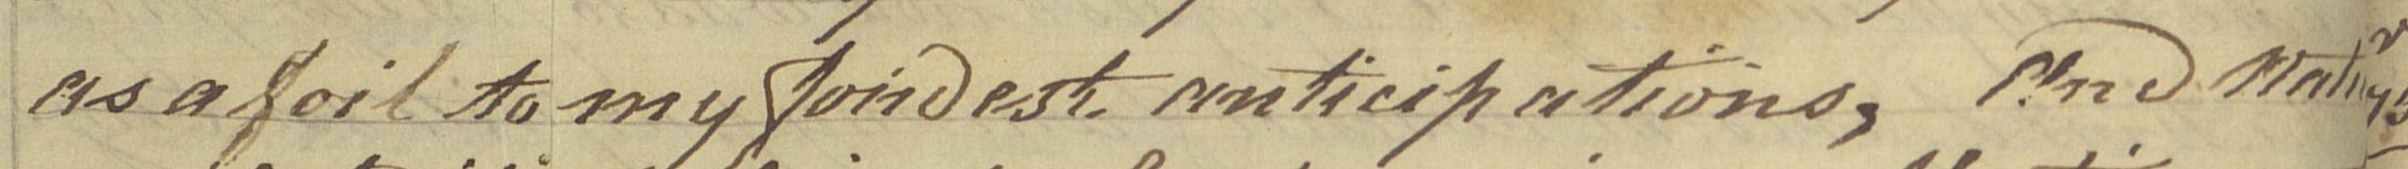as a foil to my fondest anticipations, And Nat-
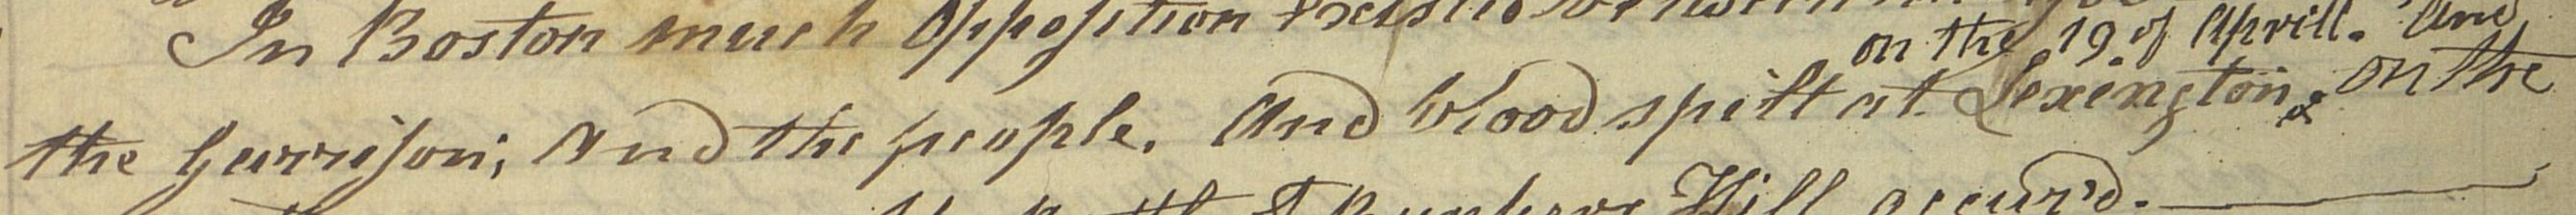the Garrison; and the people. And blood spilt at Lexington ^ on the
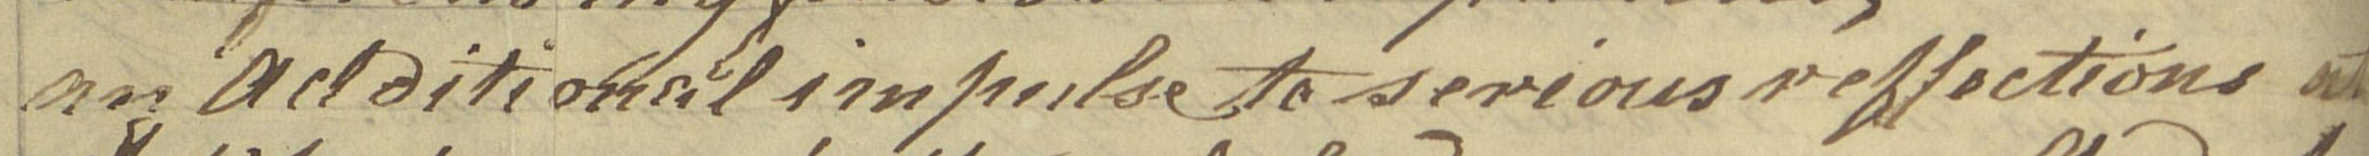an Additional impulse to serious reflections at
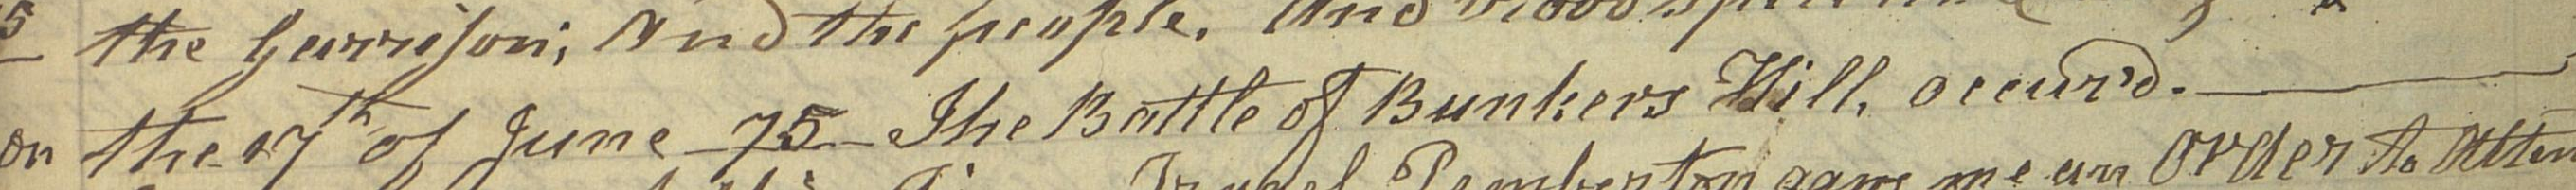on the 7^th of June 75. The Battle of Bunkers Hill occur'd.
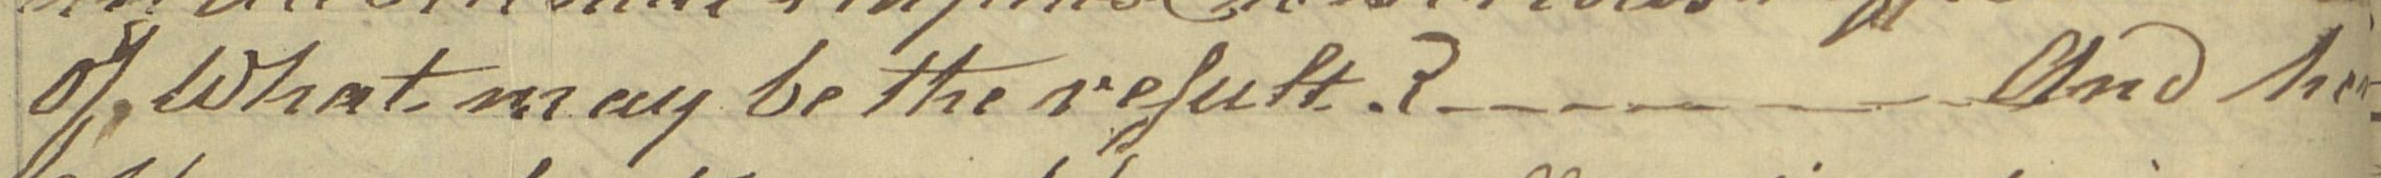of What may be the result? And her
